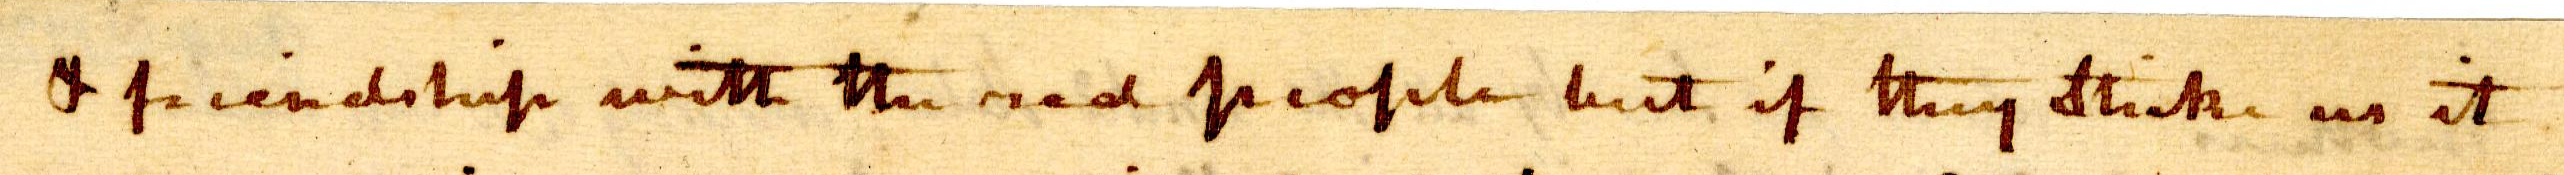& friendship with the red people but if they Strike us it
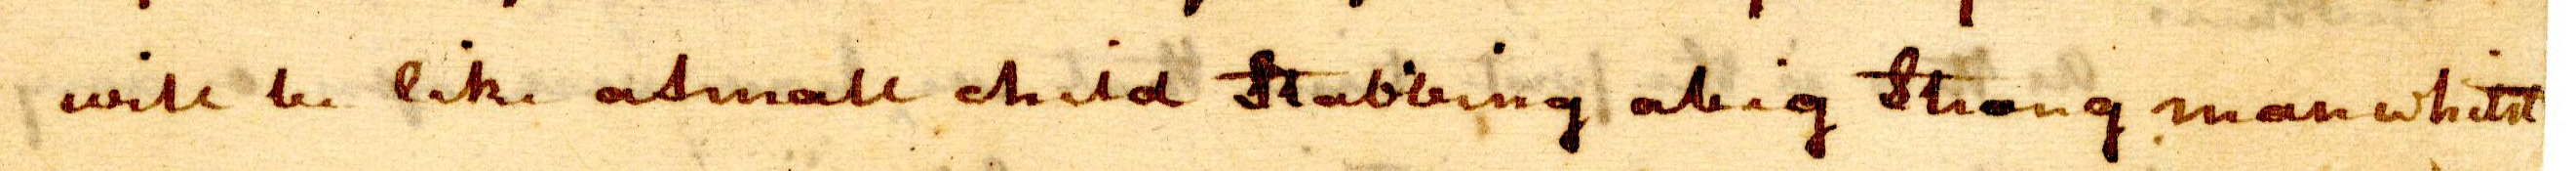will be like a small child Stabbing a big Strong man whilst
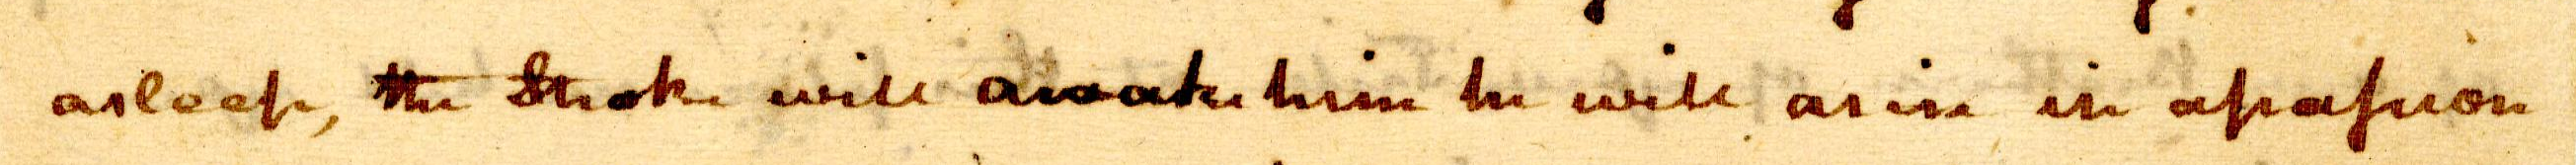asleep, the Stroke will awake him he will arise in apassion
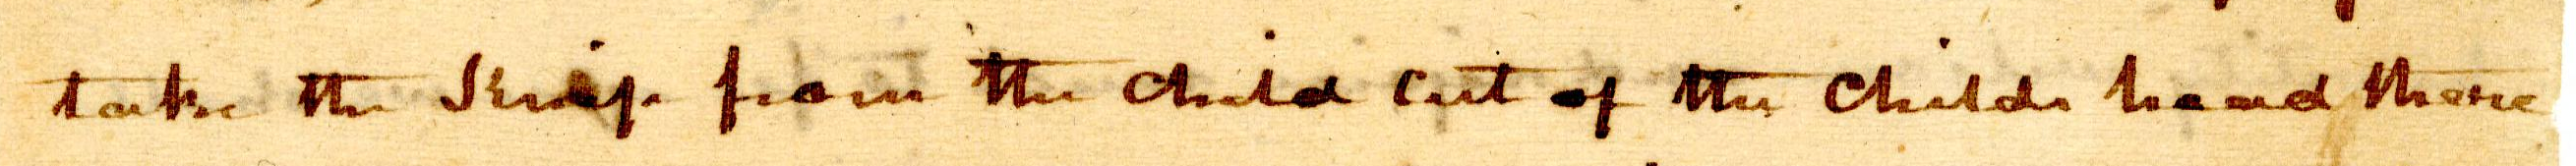take the knife from the Child cut of the Childs head there
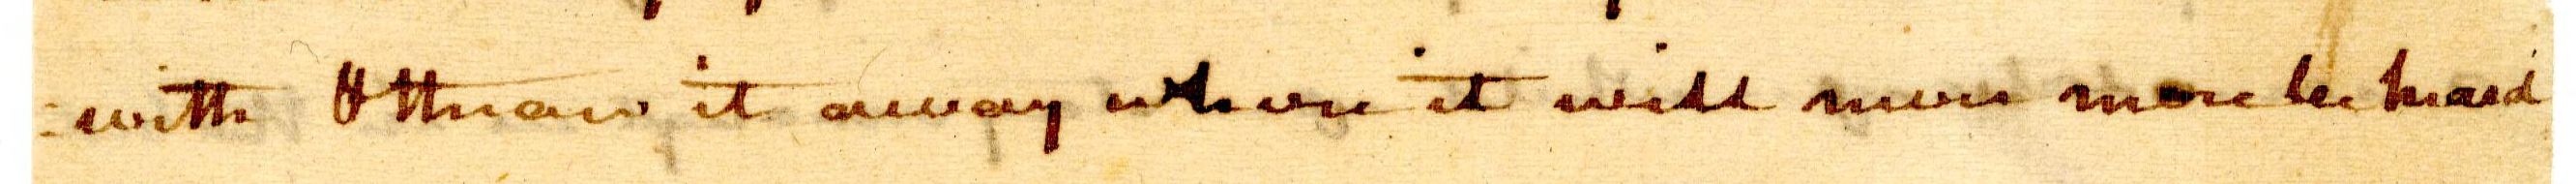with & throw it away where it will never more be heard
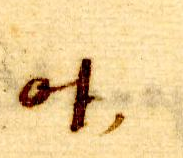of.
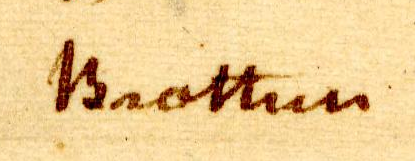Brothers
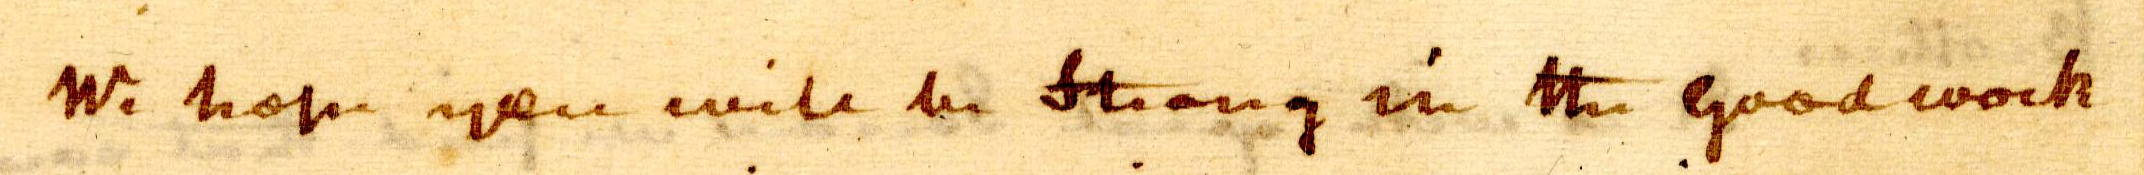We hope you will be Strong in the Good work
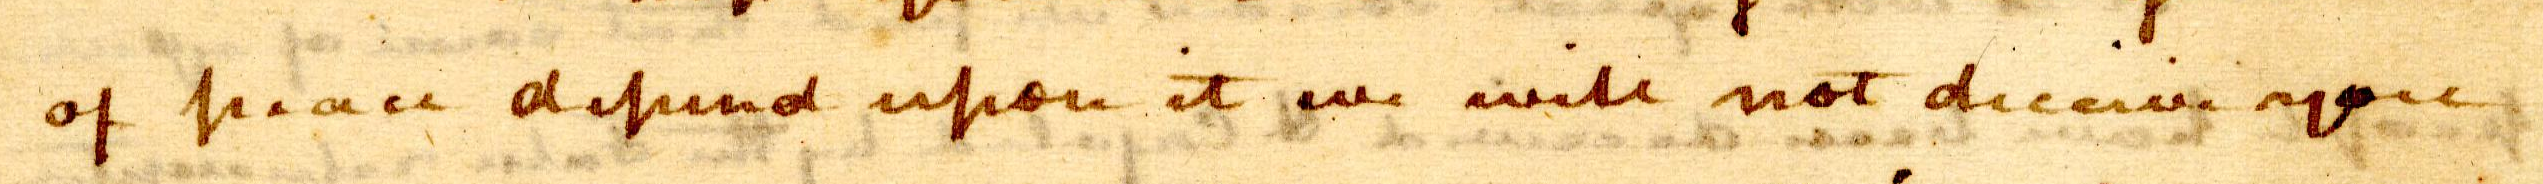of peace depend upon it we will not deceive you
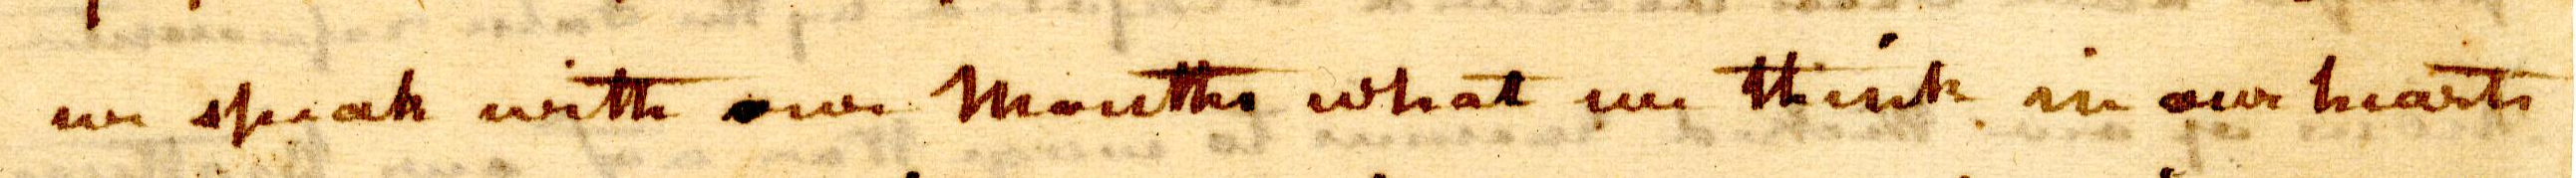we speak with our Mouths what we think in our hearts
